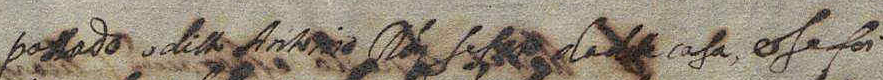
passado o ditto Antonio Roz̄ se foi da dita casa, e se foi
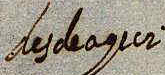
desde aqui
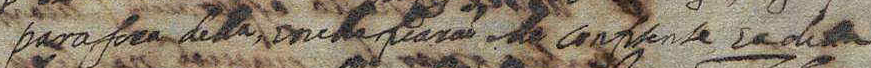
para fora della, e nella ficaraõ ella confitente E a ditta
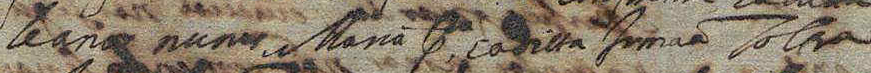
Leanor nunes, Maria pra e a ditta Jrmaā soltra
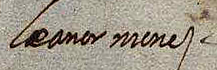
leanor nunez
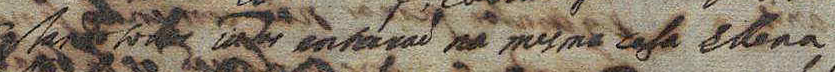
estando todas iūtas entraraõ na mesma casa Ellena
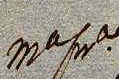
ma pra.
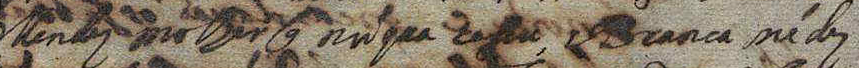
Mendez molher q̄ nūqua casou e Branca mēdez
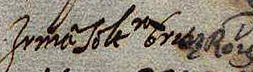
Jrmā soltra britiz Roiz
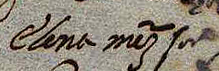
Elena mez sor
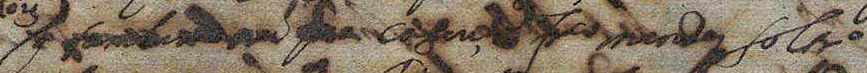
q̄ tambem nūqua casara frco mendez soltro
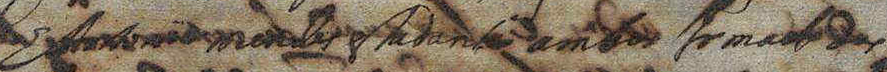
E Antonio mendes estudante ambos Irmaõs das
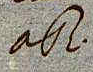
a R.
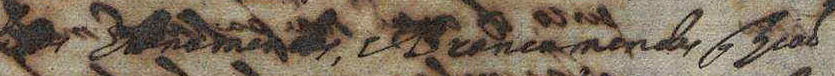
ditas Ellena mendes E Branca mendes q̄ hiaõ
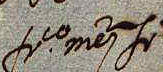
fr.co mez̄ jr
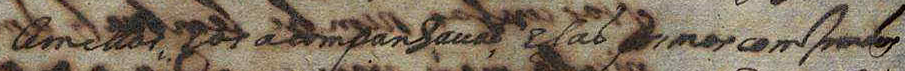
com ellas E as acompanhauaõ E saõ primos comJuntos
